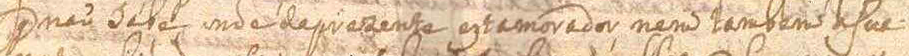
q̄ naõ sabe onde de prezente esta morador, nem tambem a sua
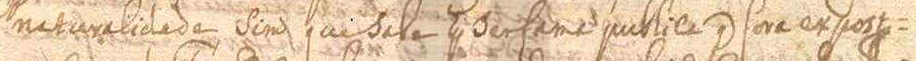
naturalidade, sim que sabe p̄ ser fama publica q̄ fora exposto
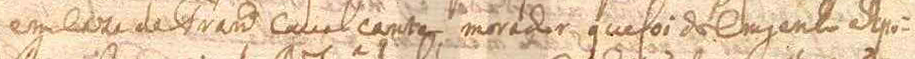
em caza de Fran.co Caualcante morador que foi do Emgenho Apo
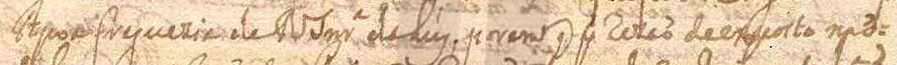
Apoa freguezia de N Snr de Lus porem q̄ p̄ Rezaõ de exposto naõ
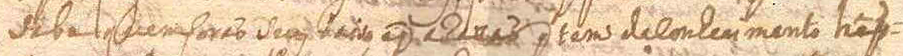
sabe quem foraõ seus pais, e q̄ a Rezaõ q̄ tem de conhecimento não
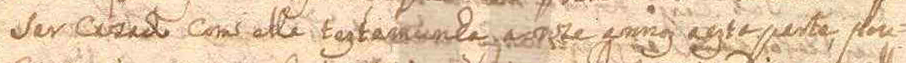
ser cazado com elle teztemunha a onze annoz a esta parte, pou
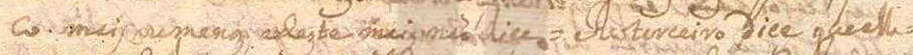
co. mais ou menoz, e dezte mais naõ dice= Ao terceiro dice que ella
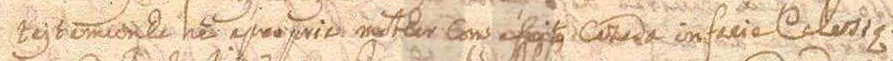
testemunha hé a propria mulher Com efeito Cazada infacie Ecleziæ
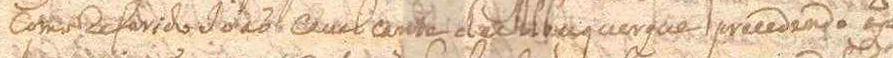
Com o Referido Ioaõ Caualcante de Albuquerque precedendo as
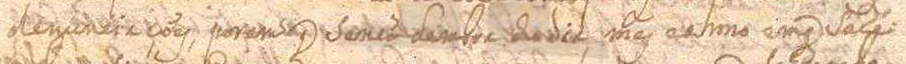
denunciações, porem q̄ se naõ Lembra do dia, mes, e anno em q̄ se Re
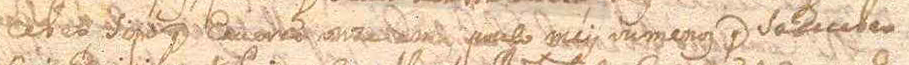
cebeo sim q̄ haueraõ onze an_ pouco mais ou menoz q̄ se Recebeo
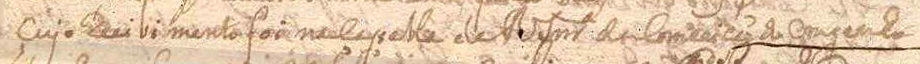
cujo Recibimento foi na Capella da N Snr.a da Comceiçaõ do Engenho
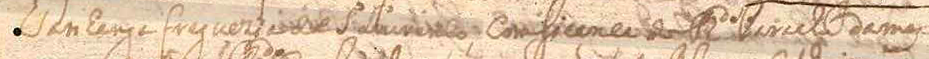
Tanhenga freguezia de S Lourenço, Com licença do R.do Parocho da mes
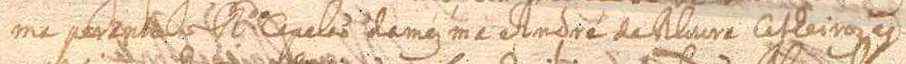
ma perzente o R.do Capelaõ da mezma Andre da Moura Calheiroz as
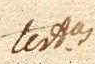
test.as
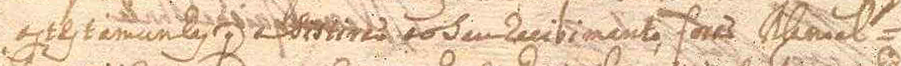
as testemunhas q̄ asistiraõ ao Seu Recibimento, foraõ Manoel
